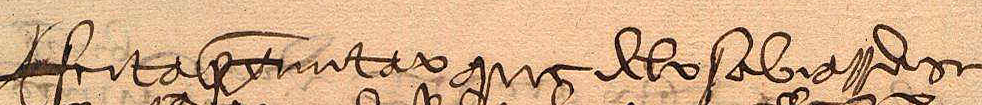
E feita p̄gunta o que delo sabia // dise
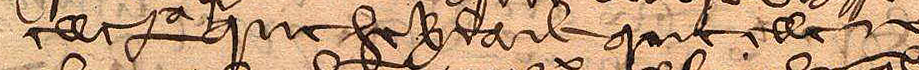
elle ta que he ꝟdade que elle co
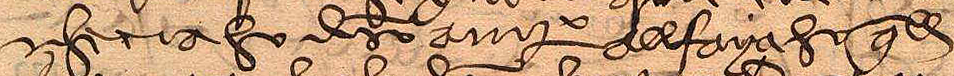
nhecia ho dito amto allfaya ho q̄ll
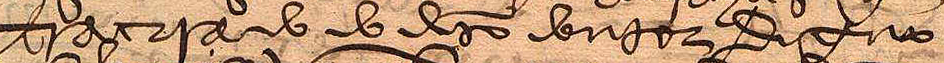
Era crjado do dito doutor diguo
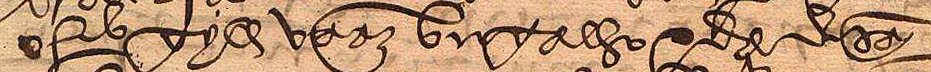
o Ldo gyll vāaz bugalho e da dita
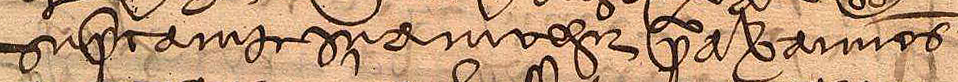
sup̄camte sua molher p̄o aꝟ annos
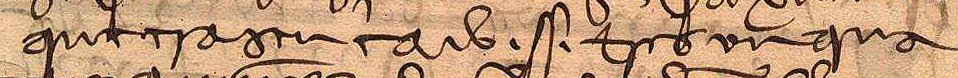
que era seu c̄ado .ss. tres ou qua
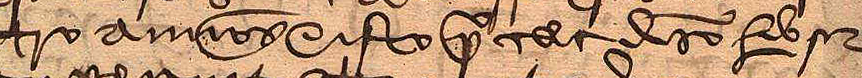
tro annos e isto p̄o elle dito Ldo ser
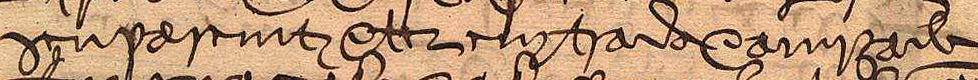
seu paremte e ter emtrada e amjzade
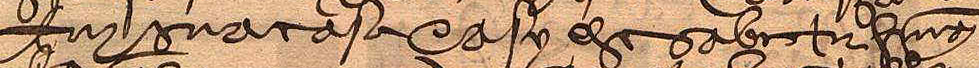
Em sua casa e asy lhe sabe ter huūa
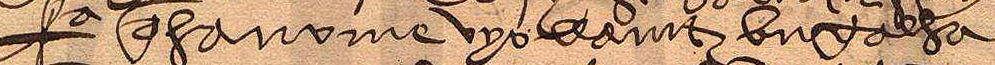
fa q̄ ha nome vyollamte bugalha
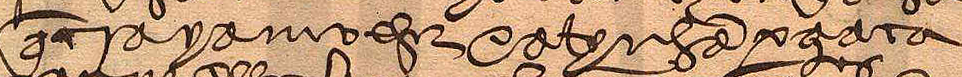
q̄ era ya molher e a tynhā ꝑa a ca
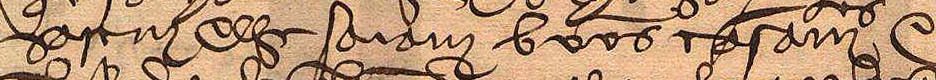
sarem e lhe saiam boōs casamtos e
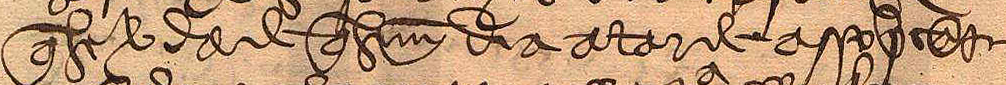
q̄ he ꝟdade q̄ huū dia a tarde a ssop̄cāte
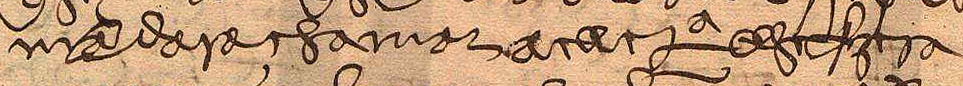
mādara chamar a elle ta e lhe fezera
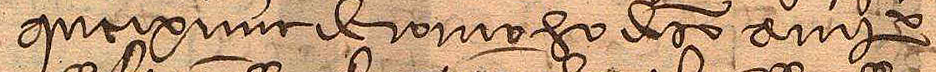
queixume de como ho dito amto
